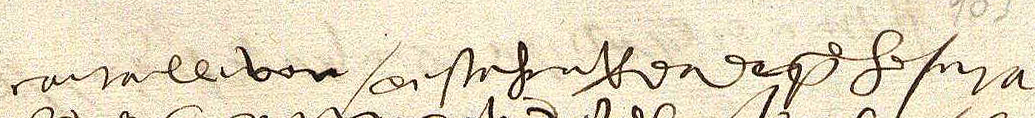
carta llevou / e esta he a ꝟdade p̄o ho Jura
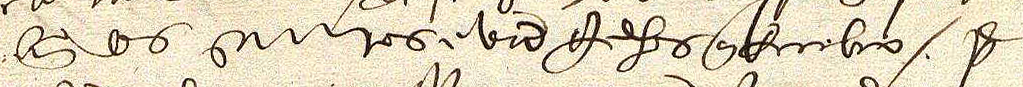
mto dos santos evāgelhos q̄ Recebeo /. p̄
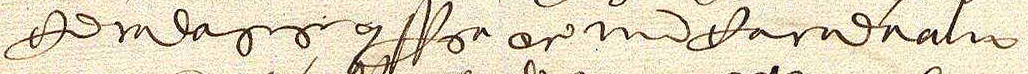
gūtada se se ꝯffesa e comūga cada ano
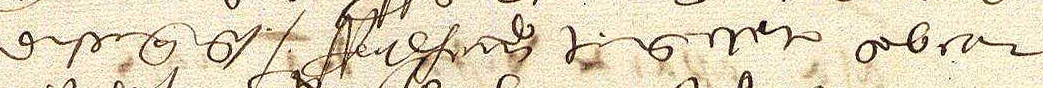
disse q̄ sy / ffoylhe mdo ter secreto sob car
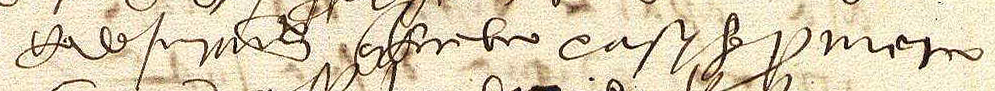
go do Juramto q̄ Recebeo e asy ꝓmeteo
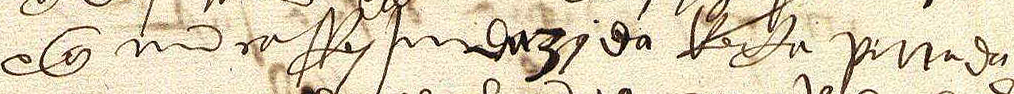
e q̄ nūca ffoy Jmduzyda Roga pejtada
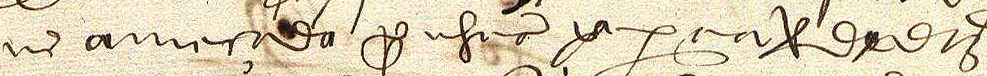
nē ameçada p̄o nhuā pa ꝑa aꝟ de diz̄
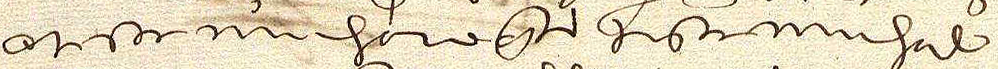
e testemunhar o q̄ tē testemunhado
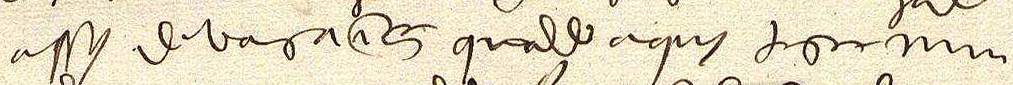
assy devasamte quādo aquj testemu
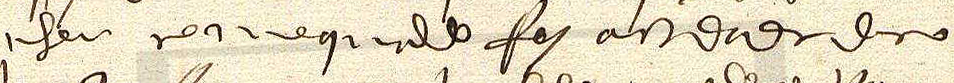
nhou como quādo foj a cidade de co
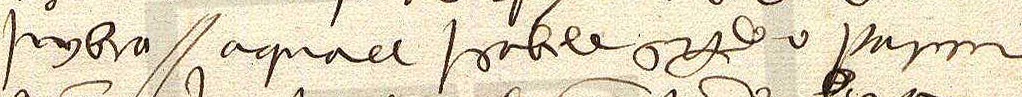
Jmbra // a quall Jsabell segdo o parecer
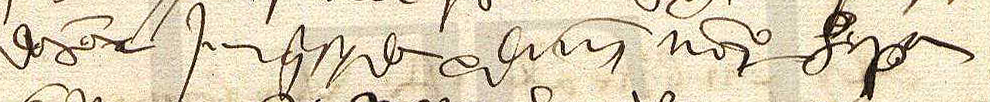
do sor Jmqisydor e de mj̄ notro he pa
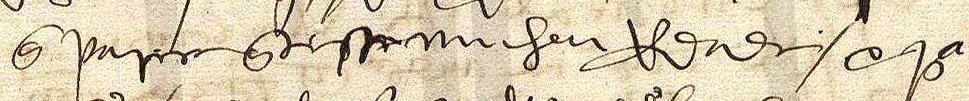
q̄ parece q̄ testemunhou ꝟdade / e pa
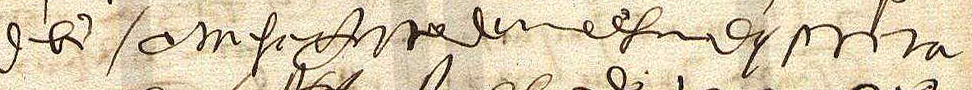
de bē / e tinha geito de molher dyscreta
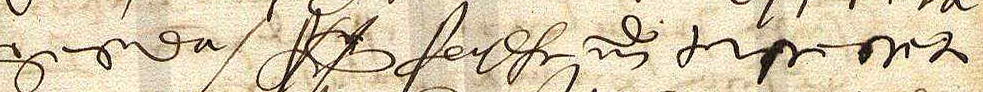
e sesuda / frco foylhe mdo ter ssecreto
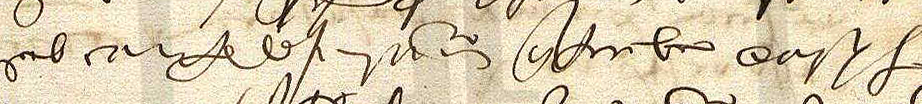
sob cargo do Juramto q̄ Recebeo e asy ho
